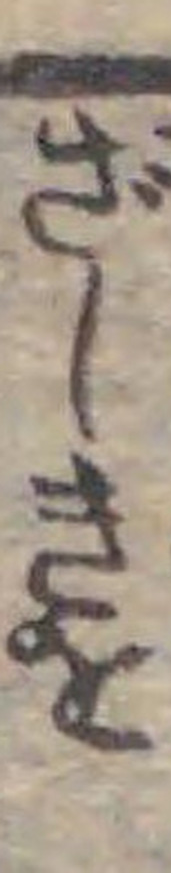ざしきを
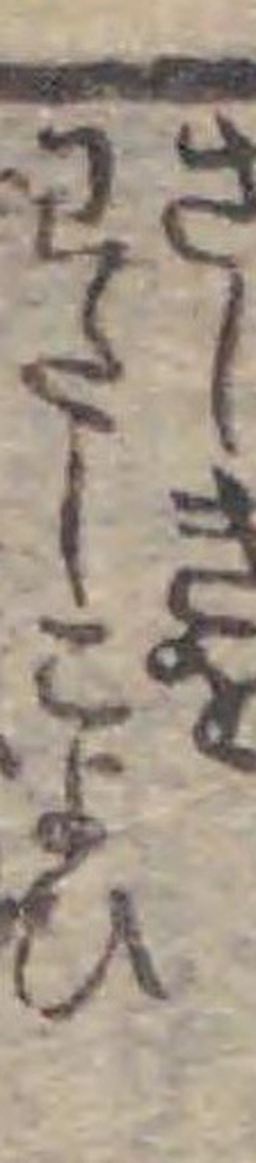わたしこよひ
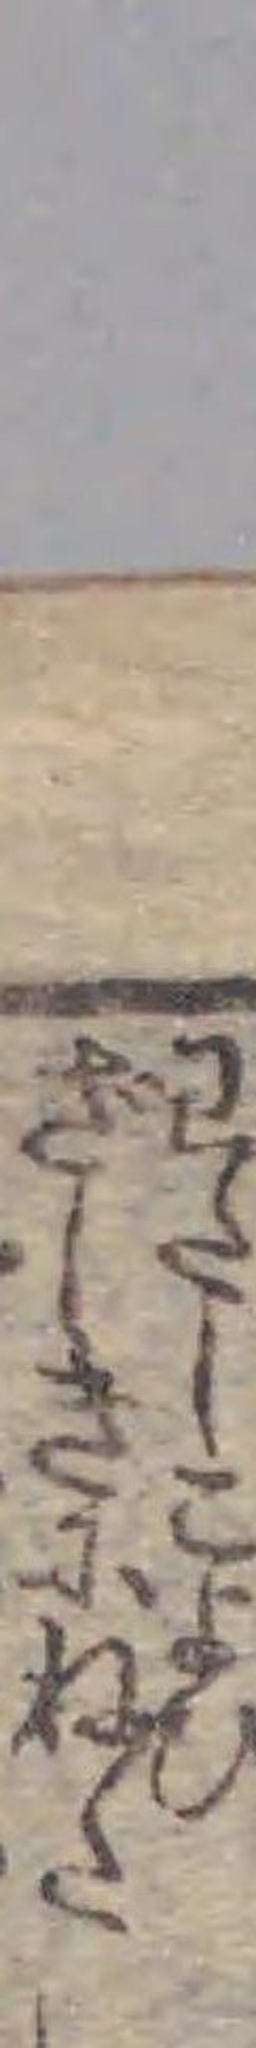ざしきにねた
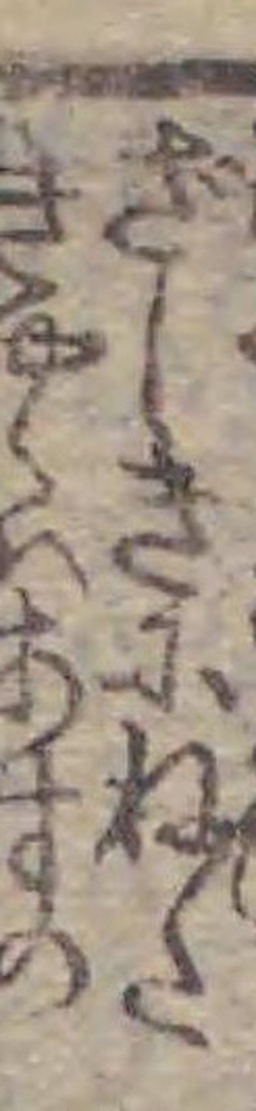きやくはあすの
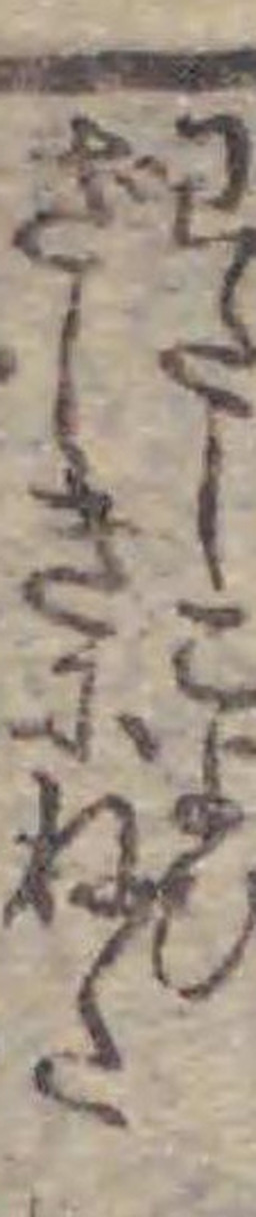ざしきにねた
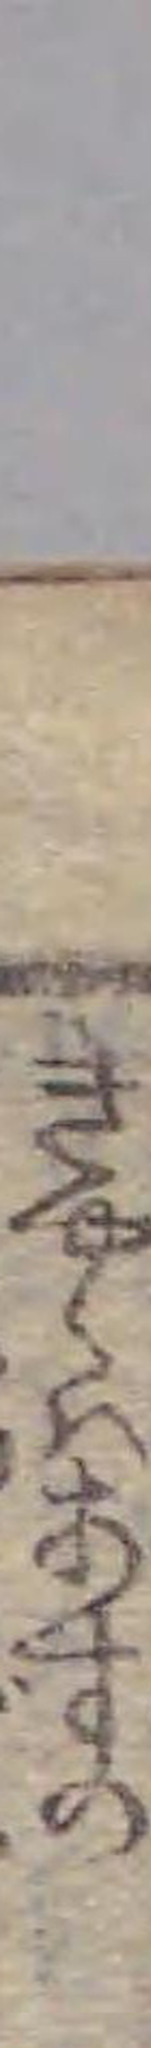きやくはあすの
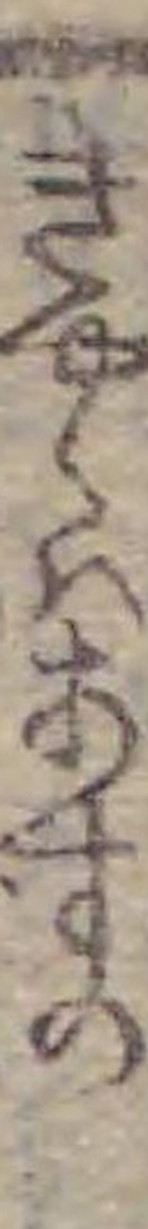きやくはあすの
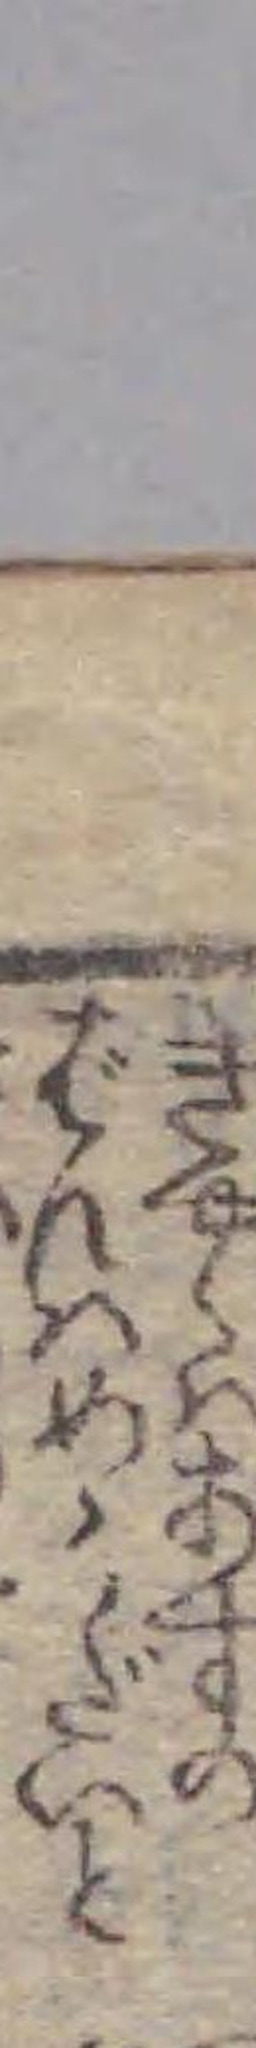ばんはめうだいと
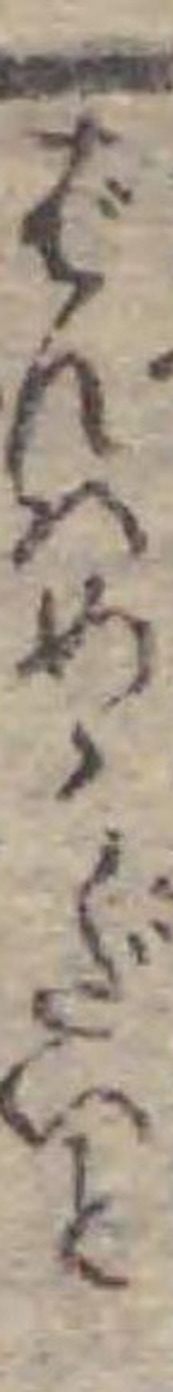ばんはめうだいと
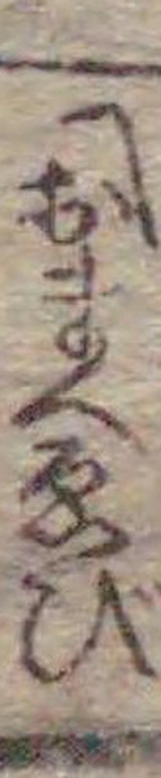〽おまへゑび
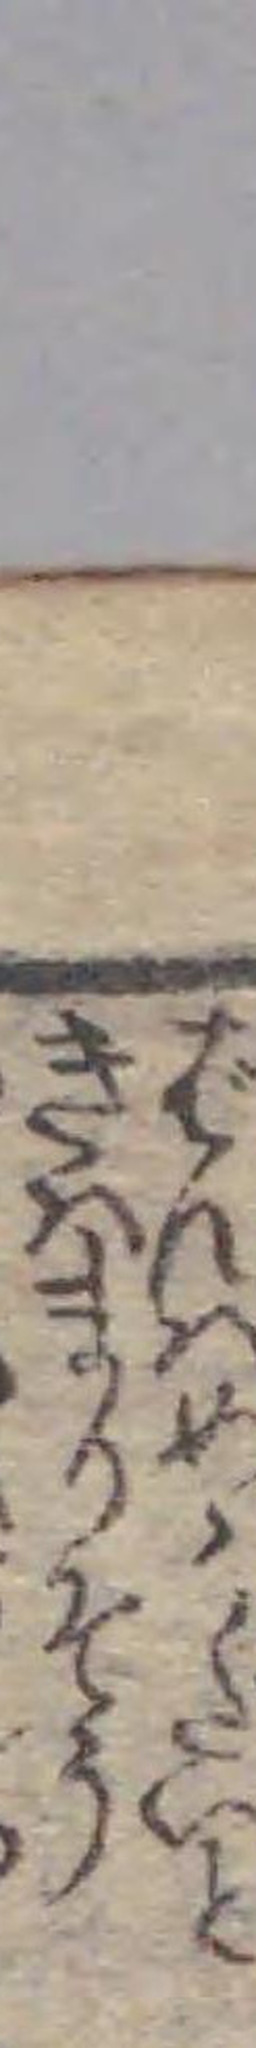きはまりそう
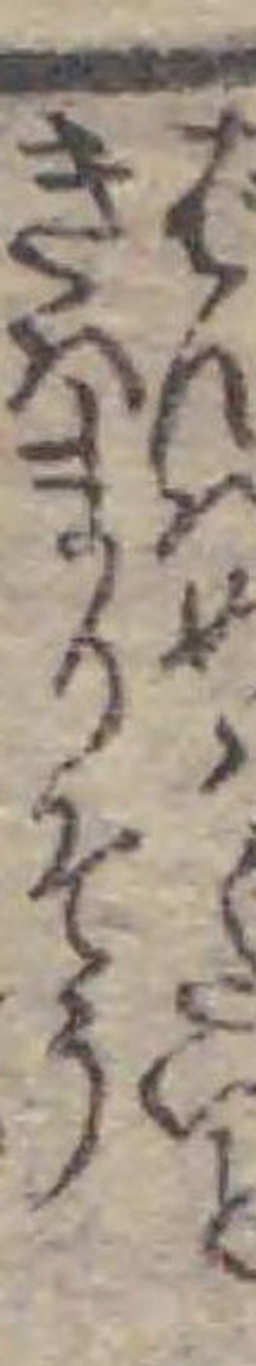きはまりそう
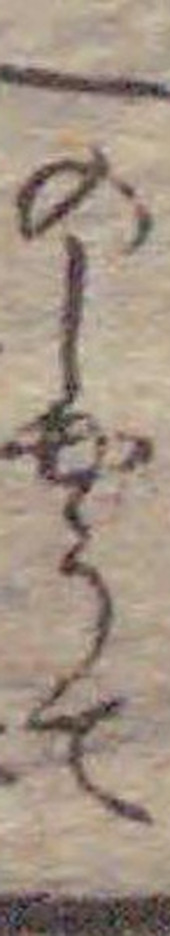のしやうて
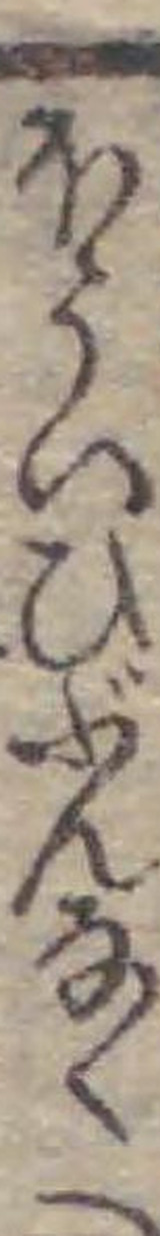ほういひぶんなく
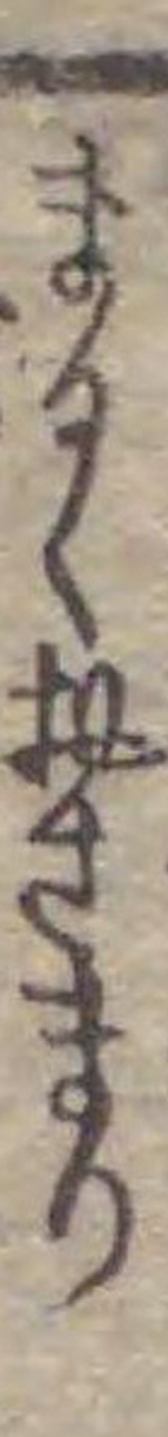まるくおさまり
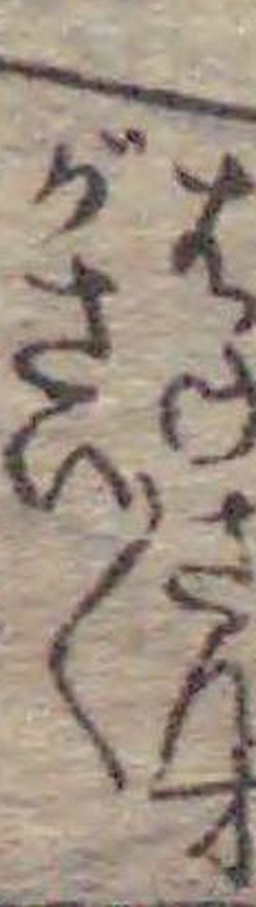がさい〳〵
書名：竜宮苦界玉手箱 : 3巻
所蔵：国立国会図書館 National Diet Library, JAPAN
